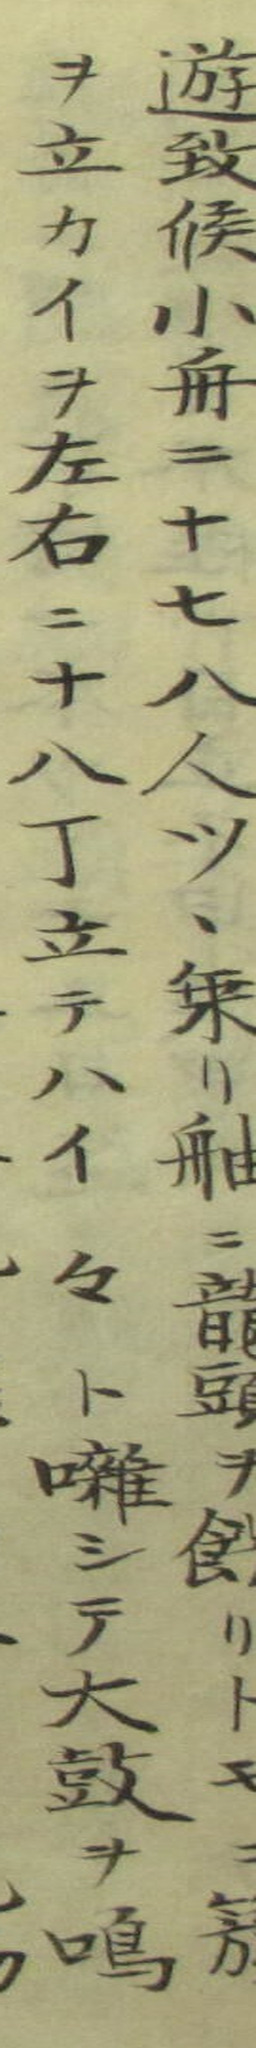ヲ立カイヲ左右二十八丁立テハイ々ト囃シテ大鼓ヲ鳴
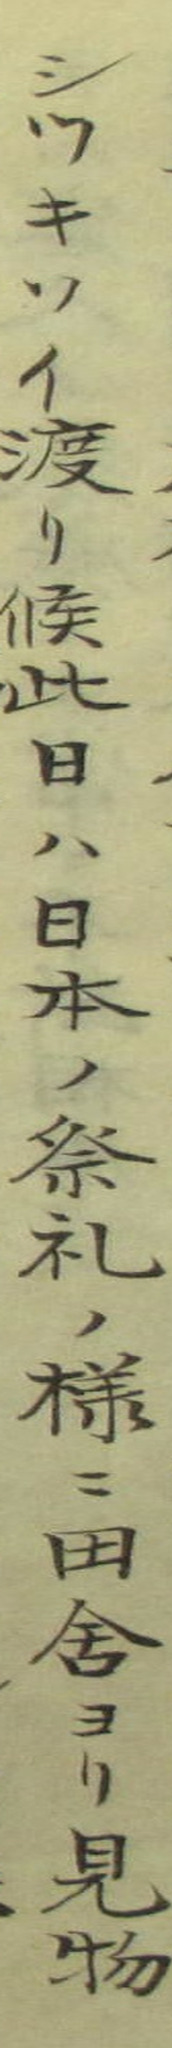シツキソイ渡リ候此日ハ日本ノ祭礼ノ様ニ田舎ヨリ見物
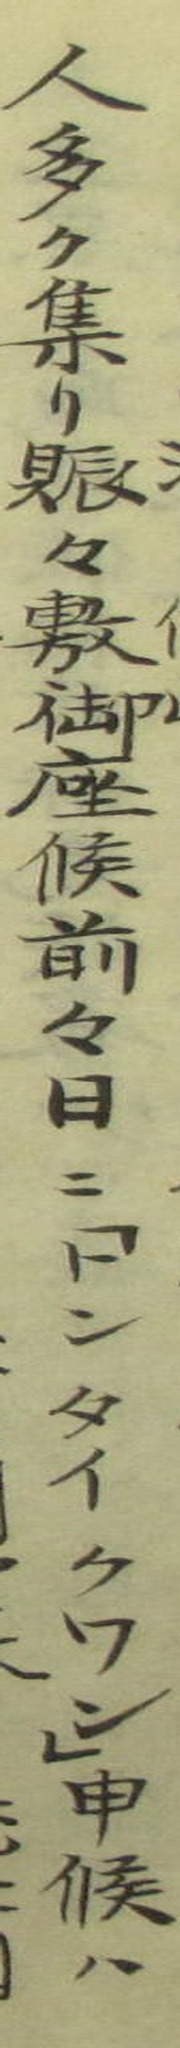人多ク集リ賑々敷御座候前々日ニ「トンタイクワン」申候ハ
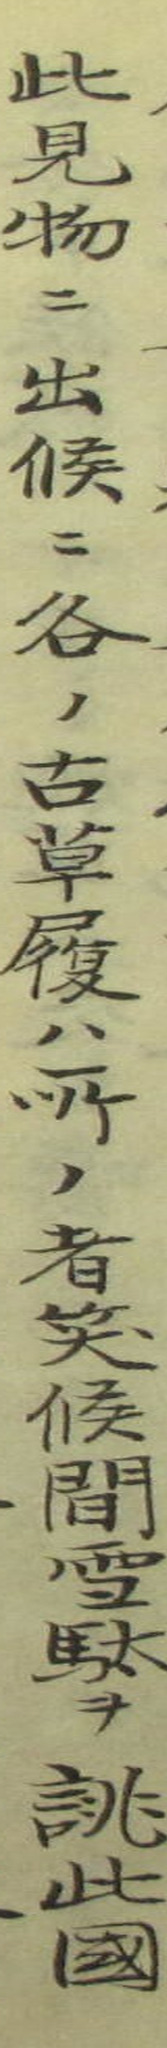此見物ニ出候ニ各ノ古草履ハ所ノ者笑候間雪駄ヲ誂此國
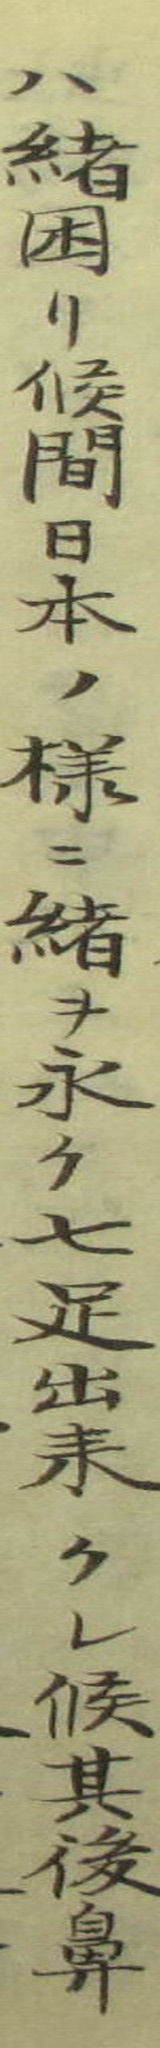ハ緒困リ候間日本ノ様ニ緒ヲ永ク七足出來クレ候其後鼻
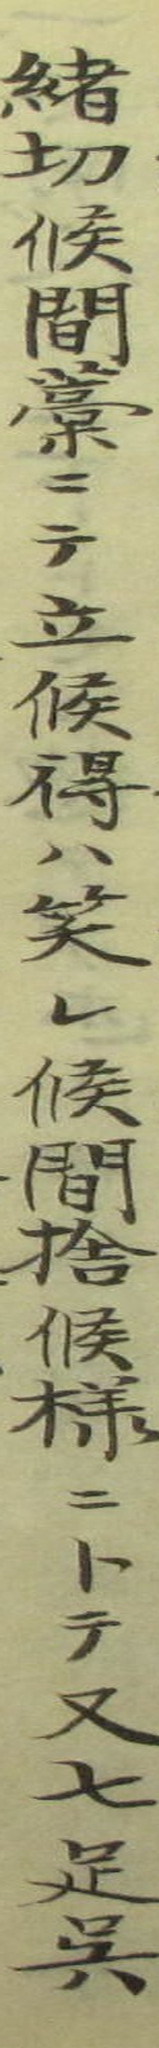緒切候間藁ニテ立候得ハ笑レ候間捨候様ニトテ又七足呉
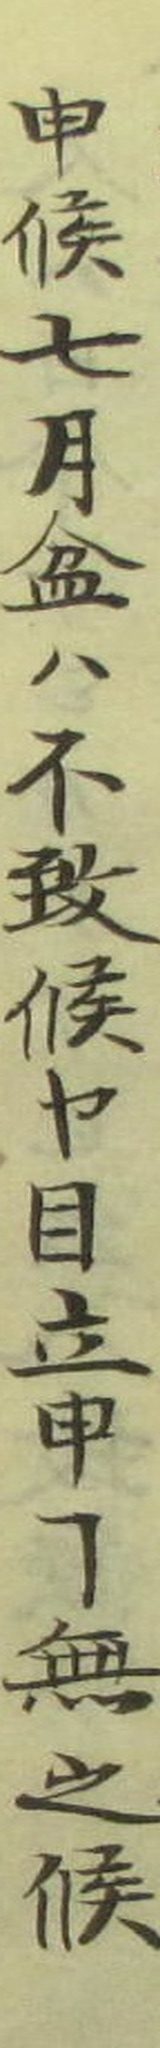申候七月盆ハ不致候ヤ目立申可無之候
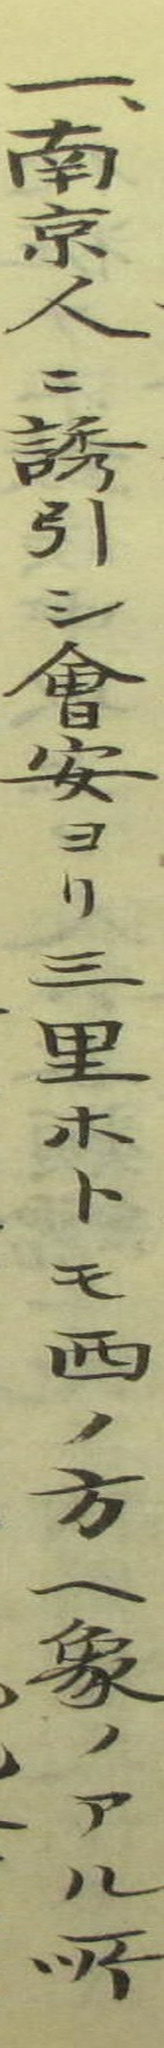一南京人ニ誘引シ會安ヨリ三里ホトモ西ノ方ヘ象ノアル所
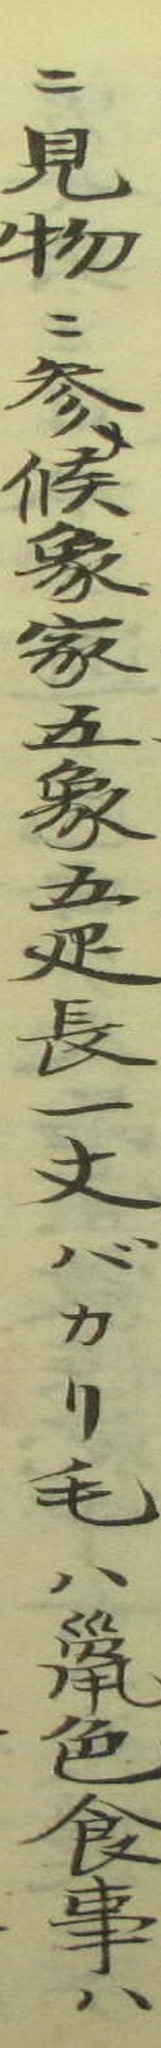ニ見物ニ参候象家五象五疋長一丈バカリ毛ハ鼠色食事ハ
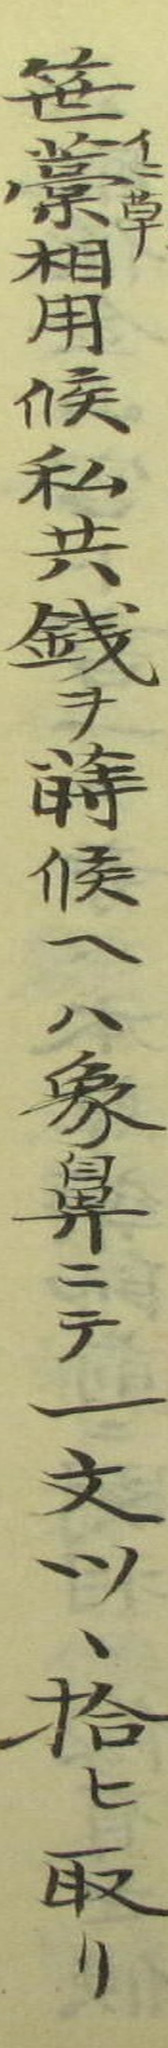笹藁相用候私共銭ヲ蒔候ヘハ象鼻ニテ一文ツヽ拾ヒ取リ
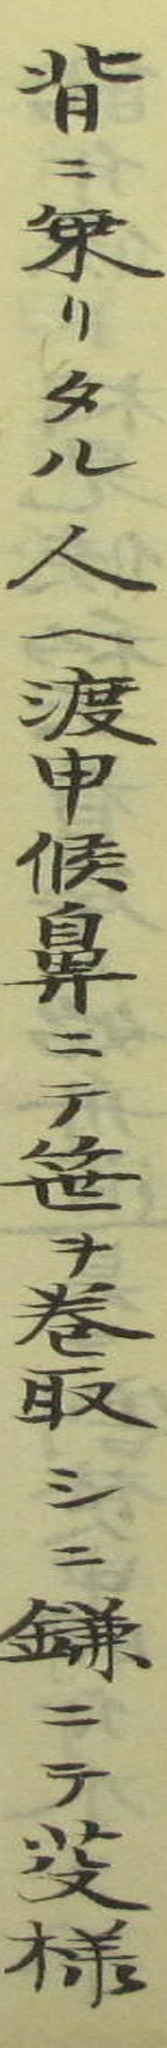背ニ乗リタル人ヘ渡申候鼻ニテ笹ヲ巻取シニ鎌ニテ芟様
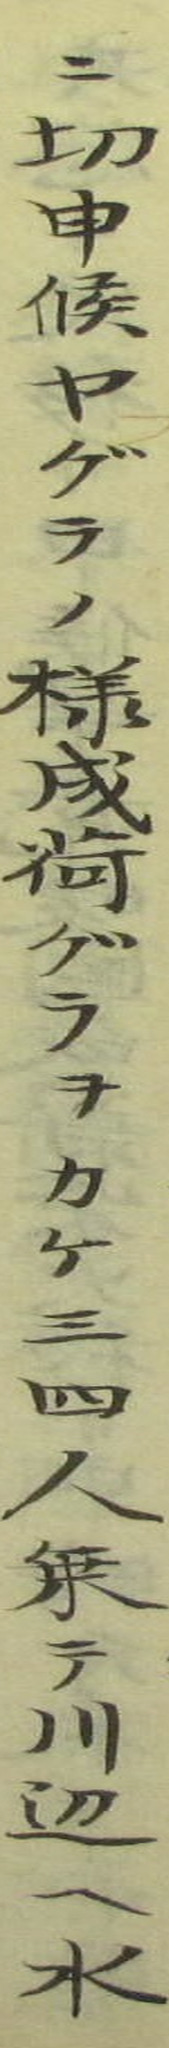ニ切申候ヤグラノ様成荷グラヲカケ三四人乗テ川辺ヘ水
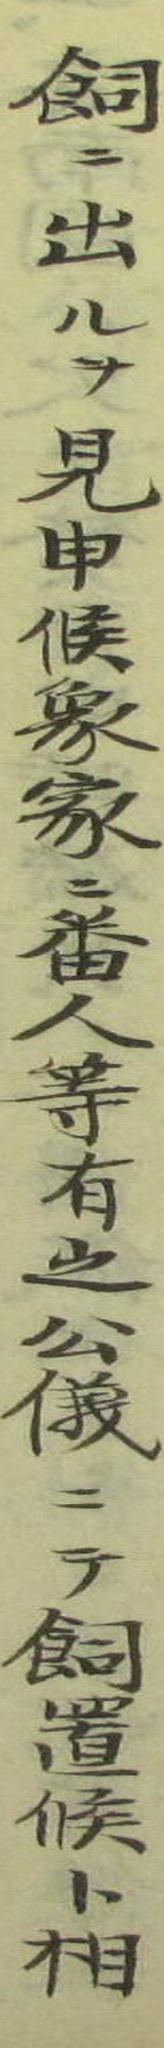飼ニ出ルヲ見申候象家ニ番人等有之公儀ニテ飼置候ト相
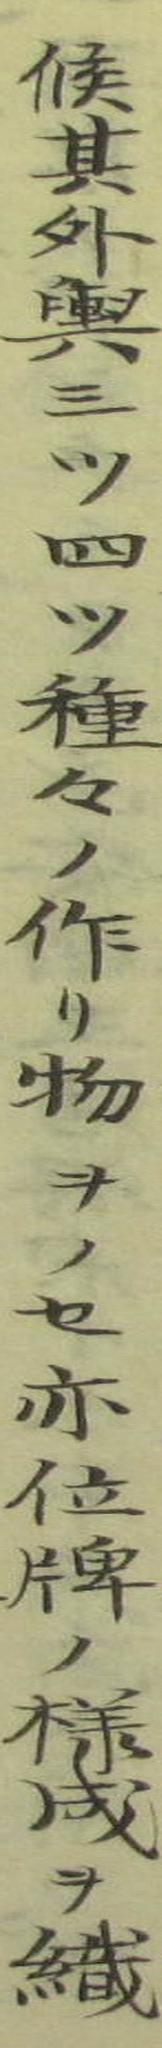候其外輿三ツ四ツ種々ノ作リ物ヲノセ亦位牌ノ様成ヲ織
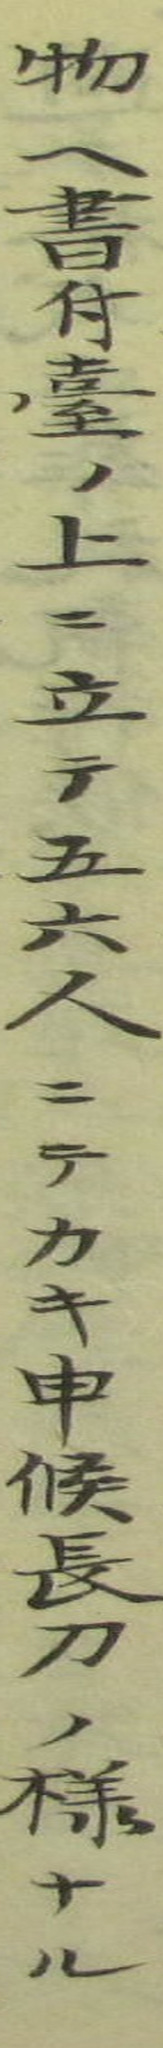物ヘ書付臺ノ上ニ立テ五六人ニテカキ申候長刀ノ様ナル
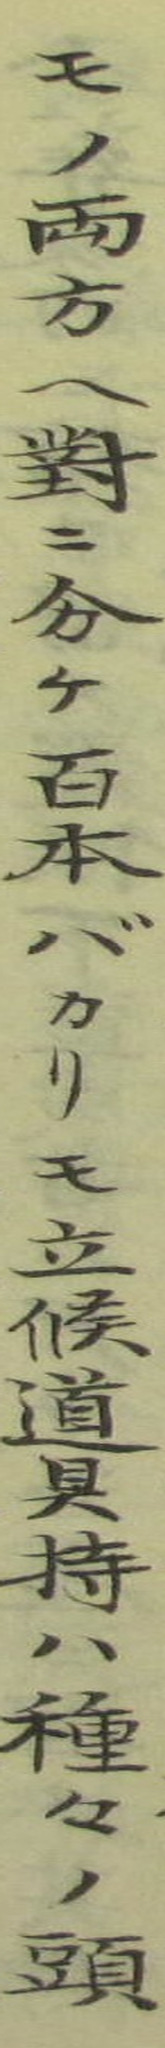モノ両方ヘ對ニ分ケ百本バカリモ立候道具持ハ種々ノ頭
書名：異国船漂着記 外二
